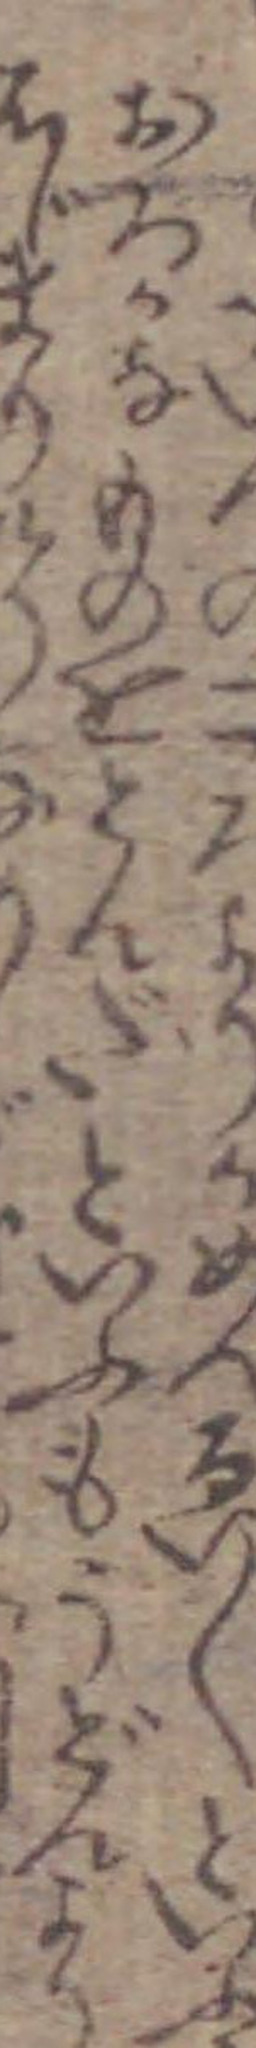おろかなものをとんだといふもうどんより
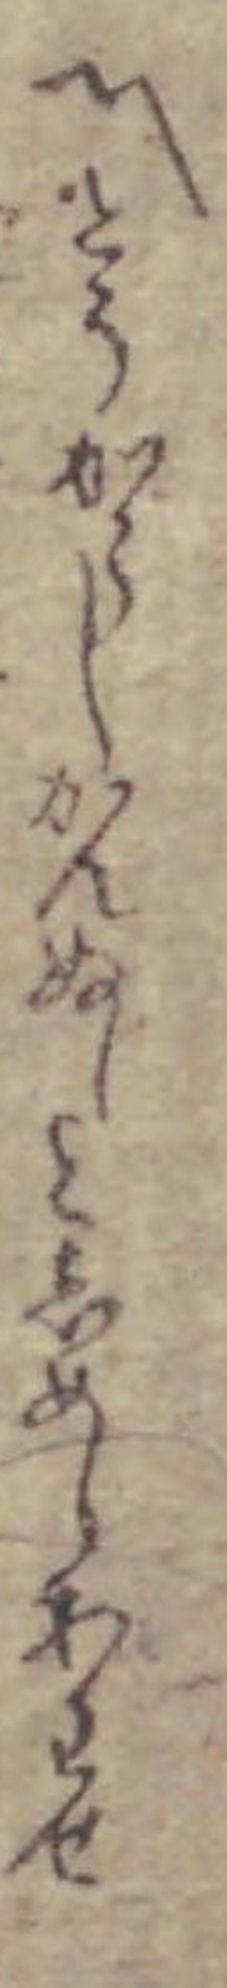〽とうからしかんぬしとしめしあわせ
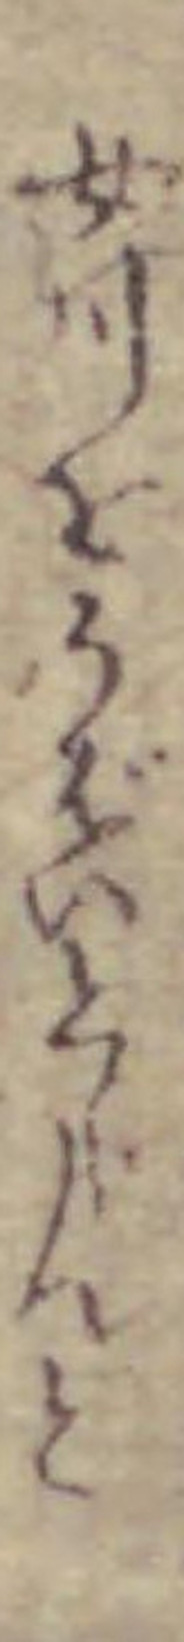女川をうばいとらんと
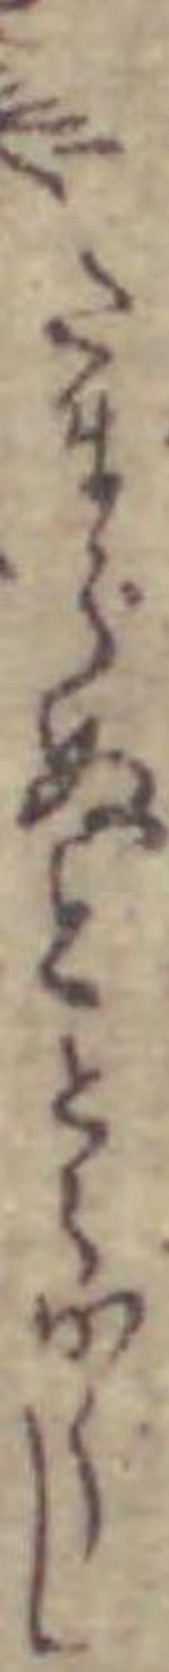たまらぬととうからし

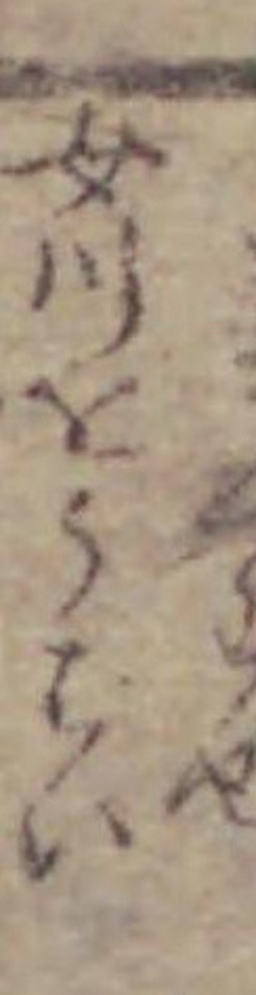女川をうはい
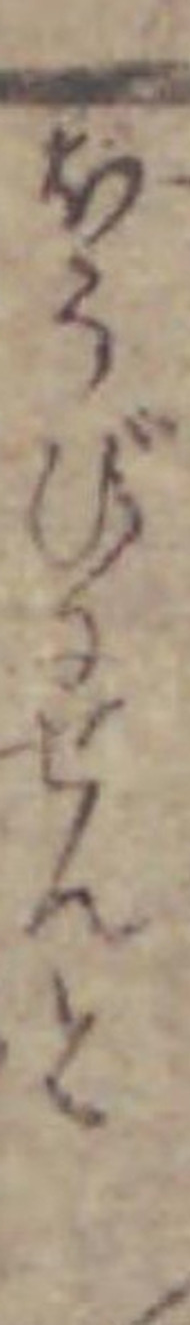ほうびにせんと
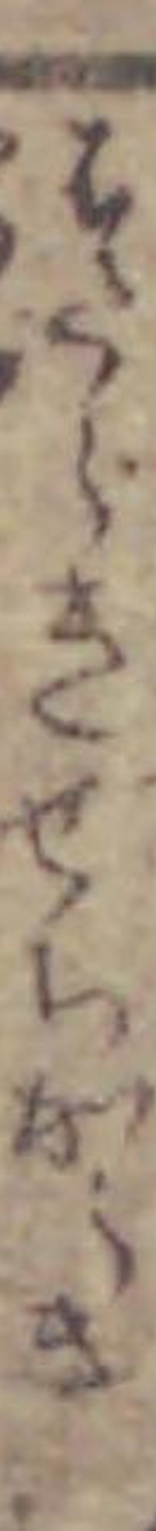はたらきせちがらき
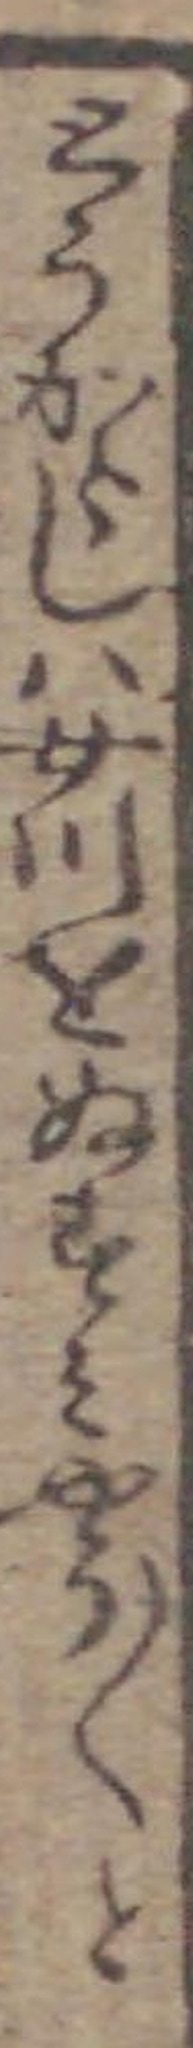とうからしは女川をぬすみやう〳〵と
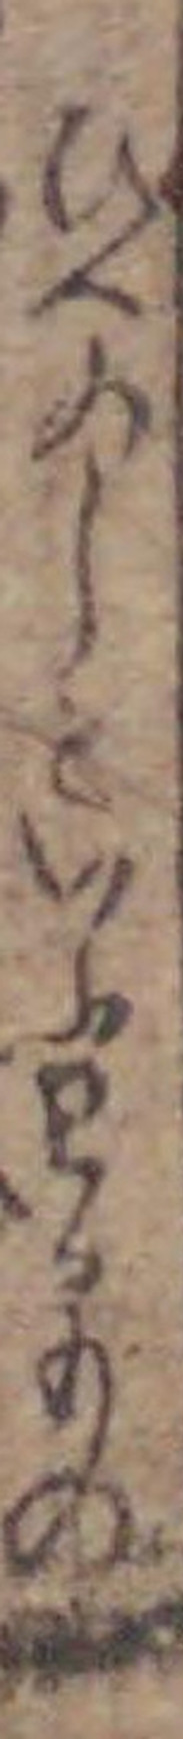ひへめしといふわかもの
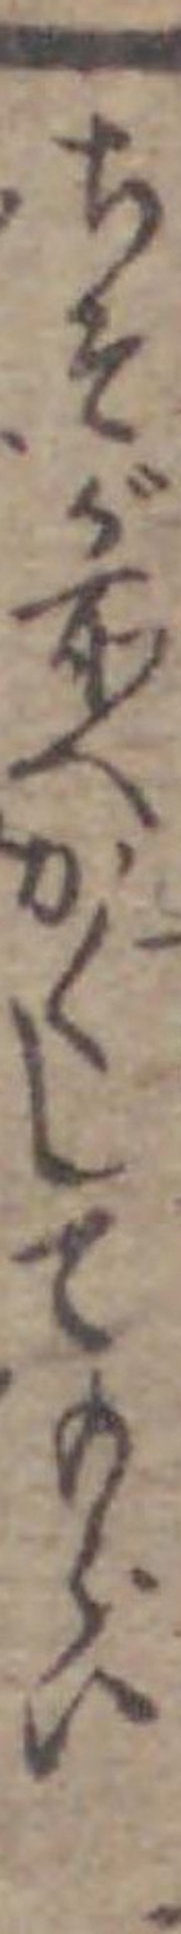ちそが所へかくしてもらい
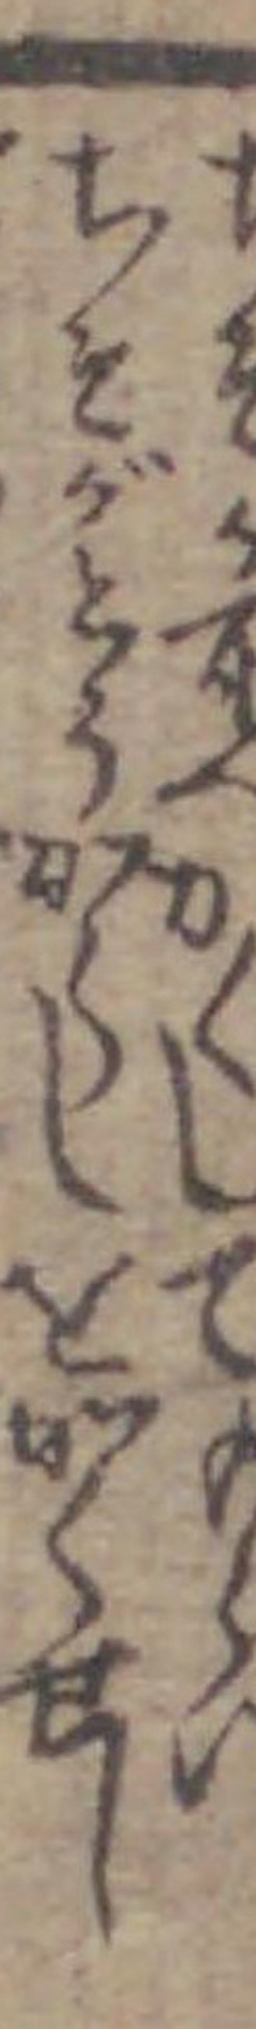ちそがとうからしをかくせし
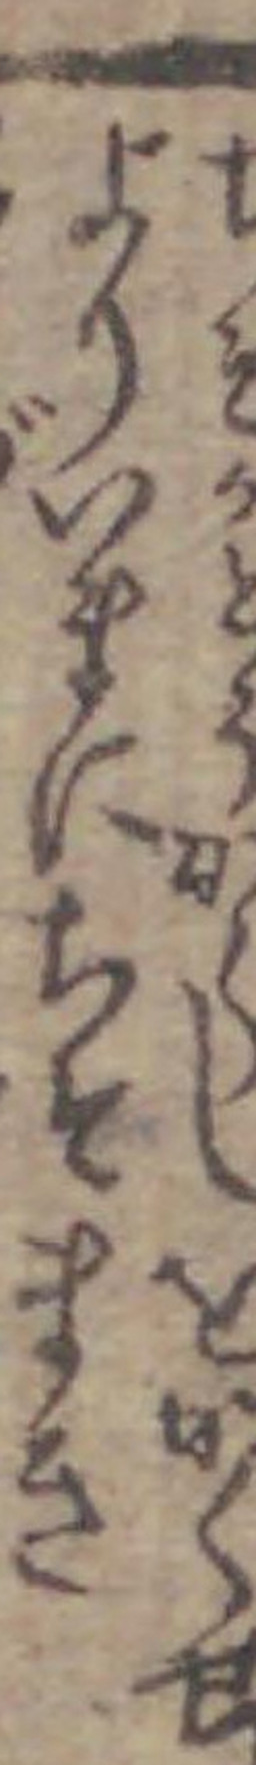よりいまにちそまき
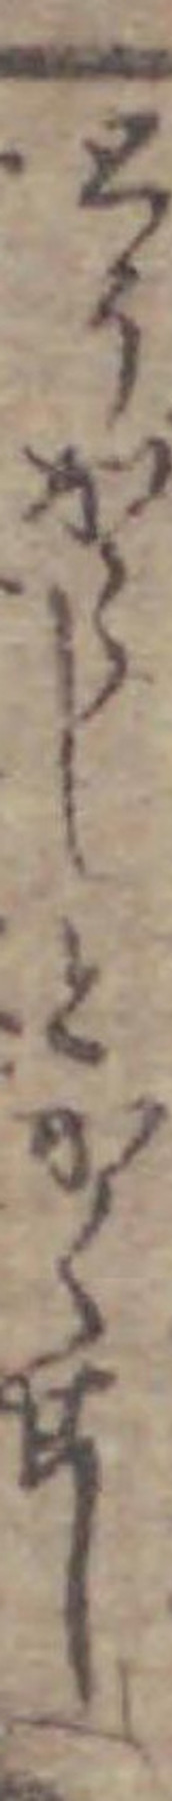とうがらしとかくせし
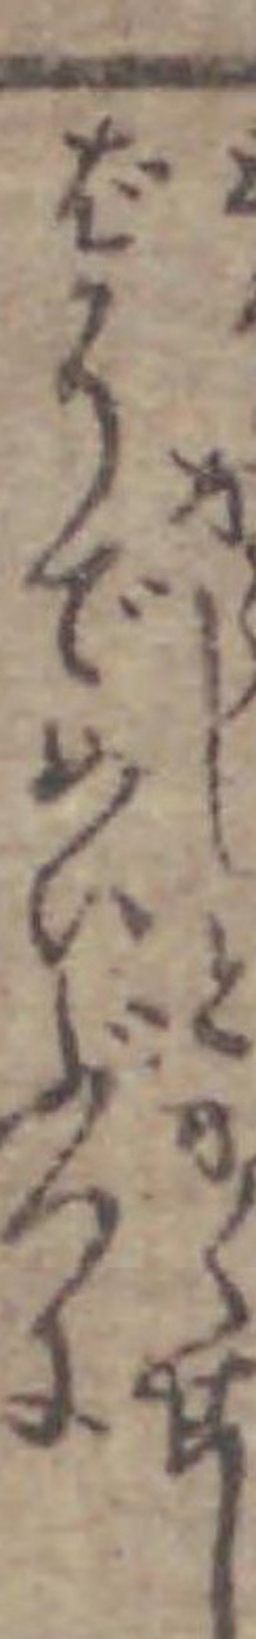ばかりでめいぶつに
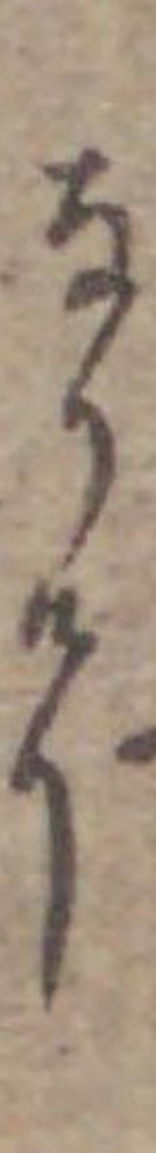なりけり
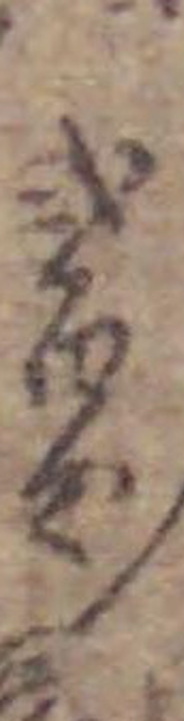弐百や
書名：諸事米の飯 : 3巻
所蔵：国立国会図書館 National Diet Library, JAPAN
